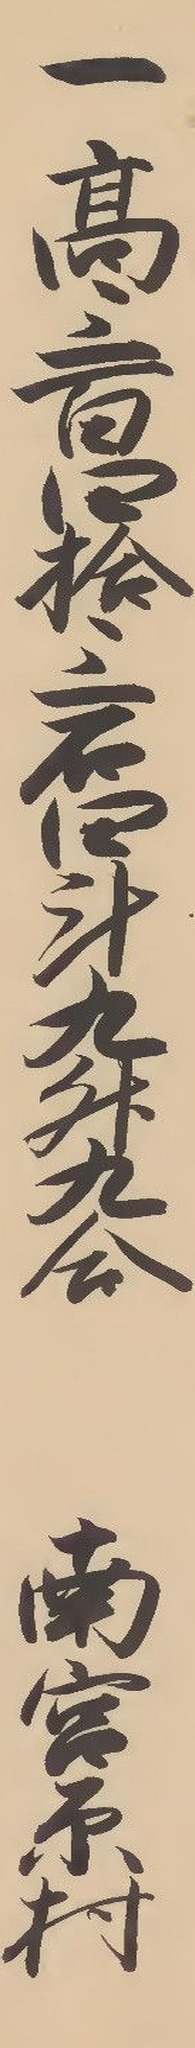一高三百四拾三石四斗九升九合南宮原村
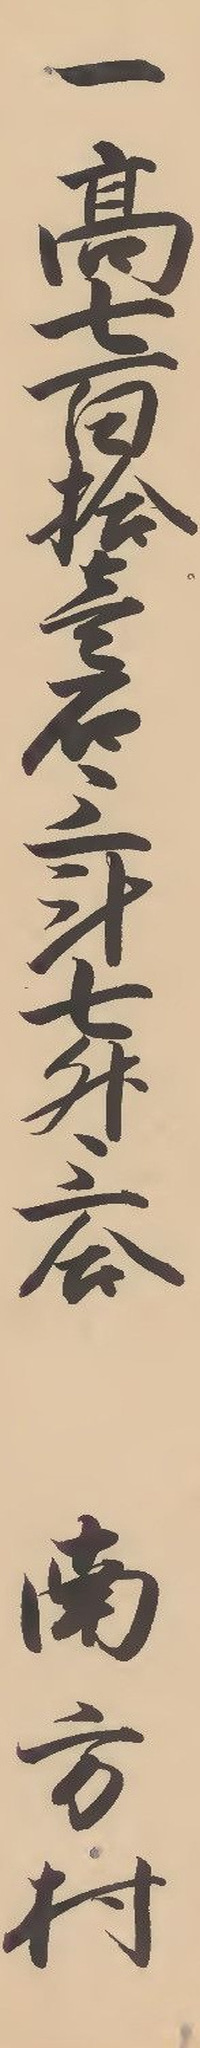一高七百拾壱石三斗七升三合南方村

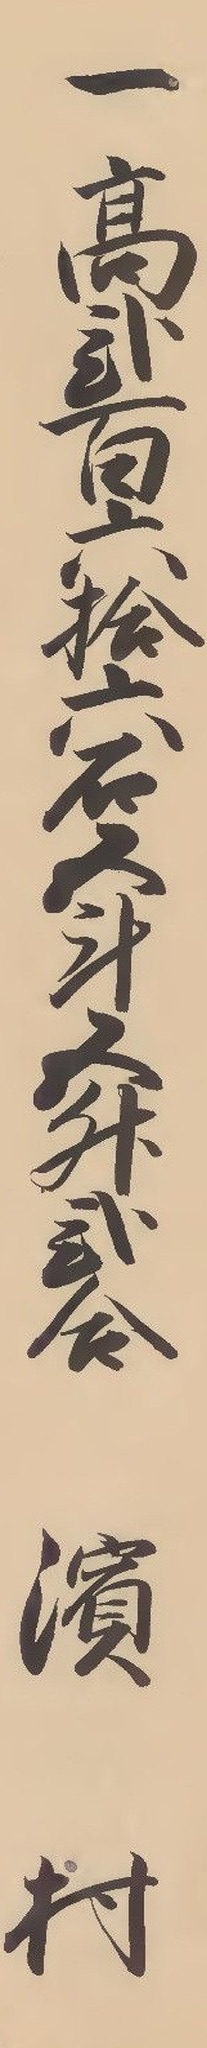一高弐百六拾六石五斗五升弐合浜村
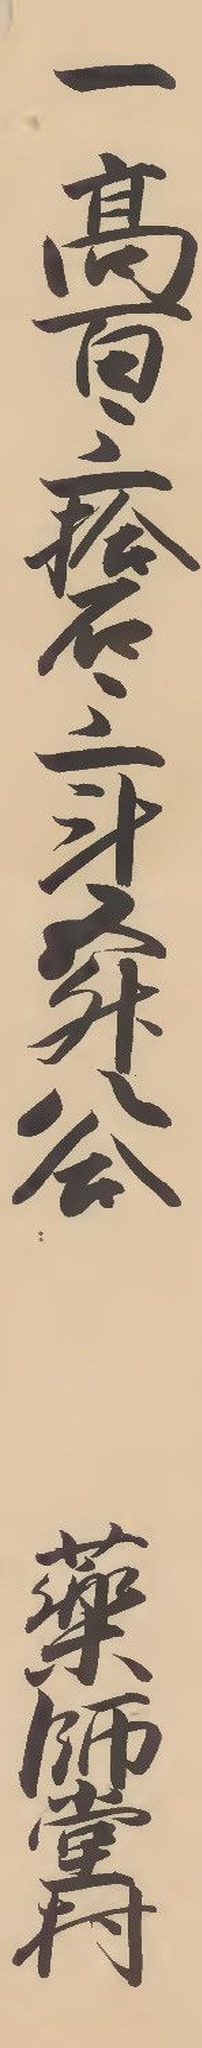一高百三拾石三斗五升八合薬師堂村
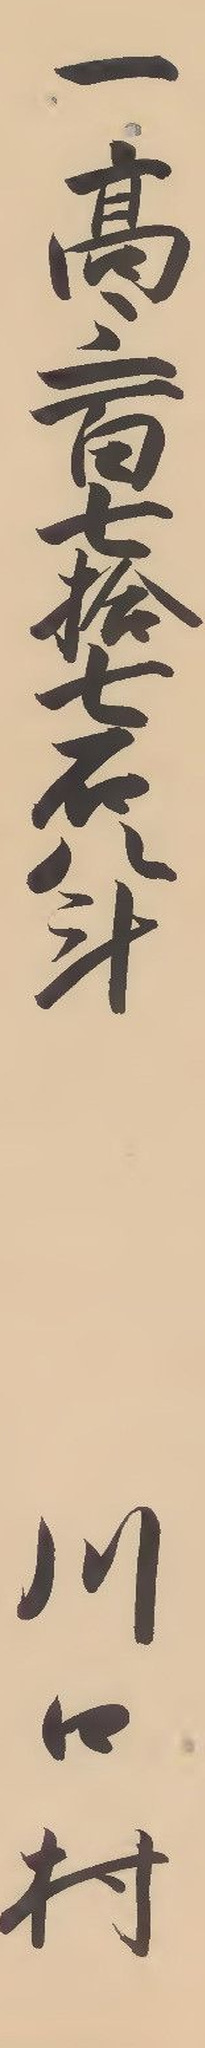一高三百七拾七石八斗川口村
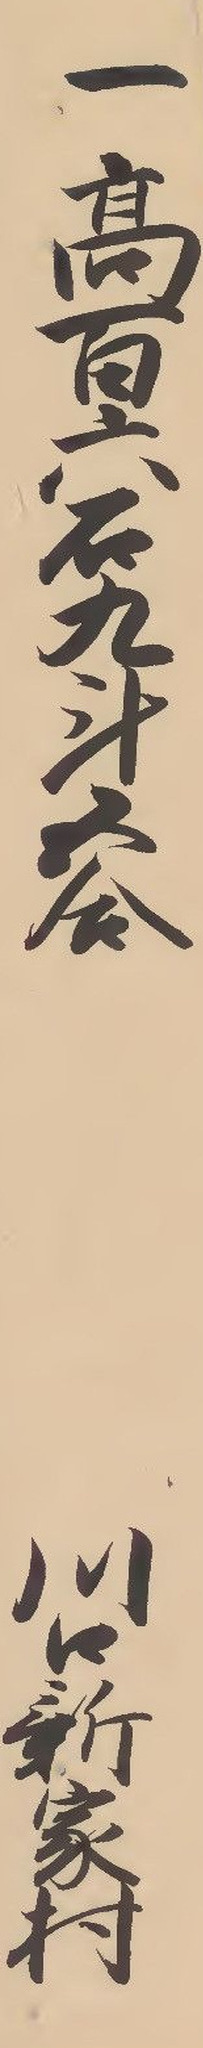一高百六石九斗五合川口新家村
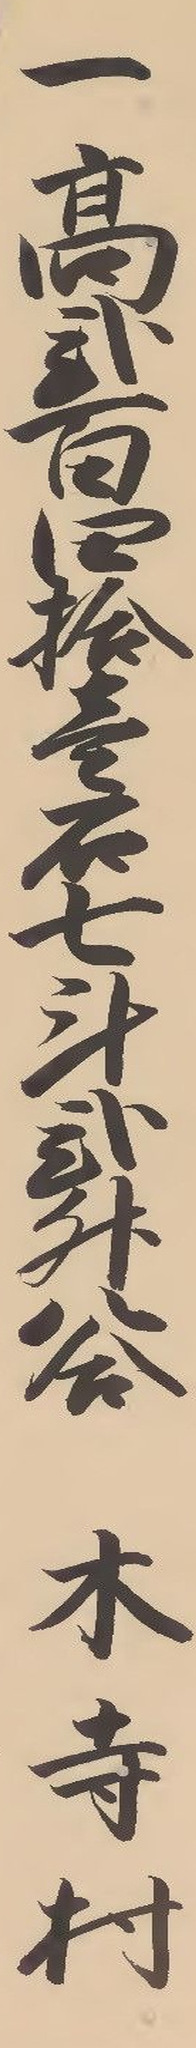一高弐百四拾壱石七斗弐升八合木寺村
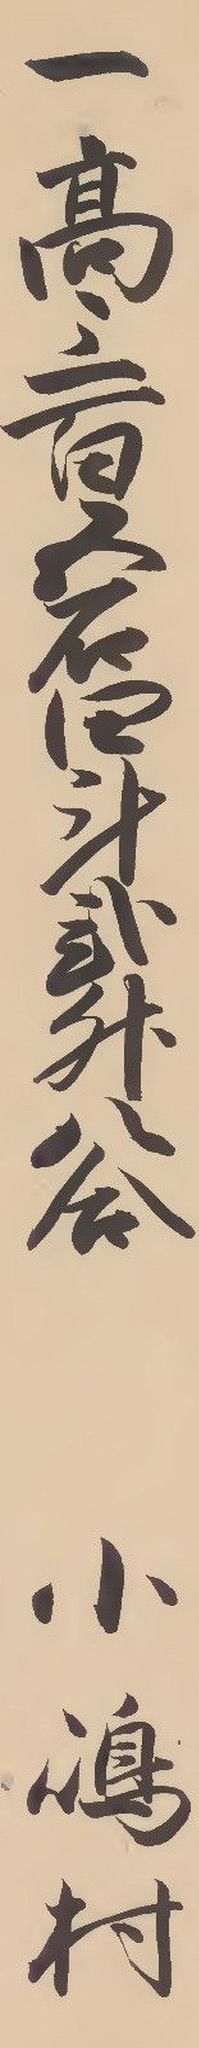一高三百五石四斗弐升八合小島村
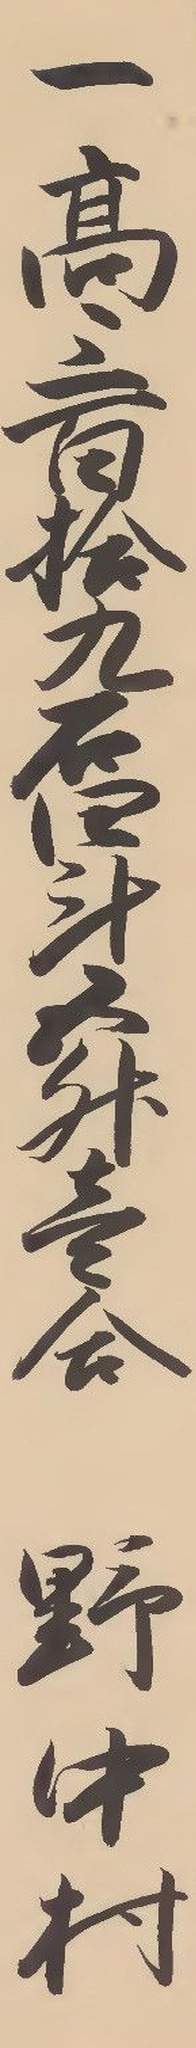一高三百拾九石四斗五升壱合野中村
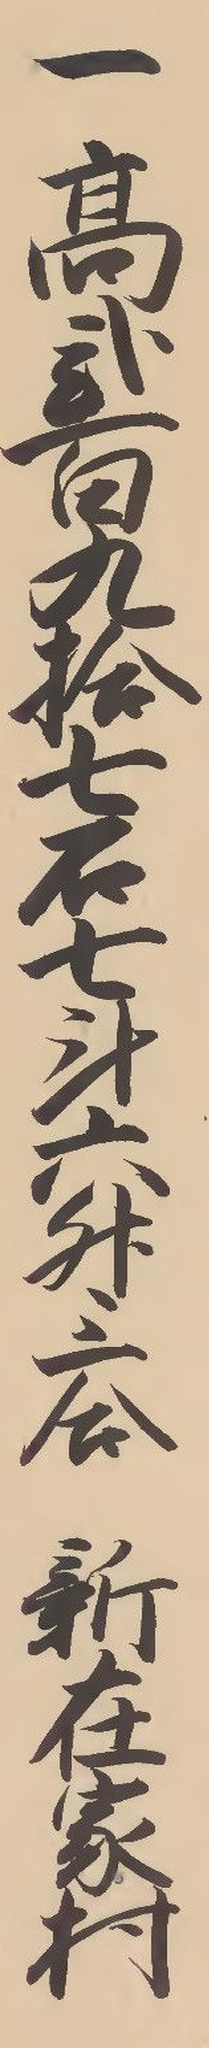一高弐百九拾七石七斗六升三合新在家村

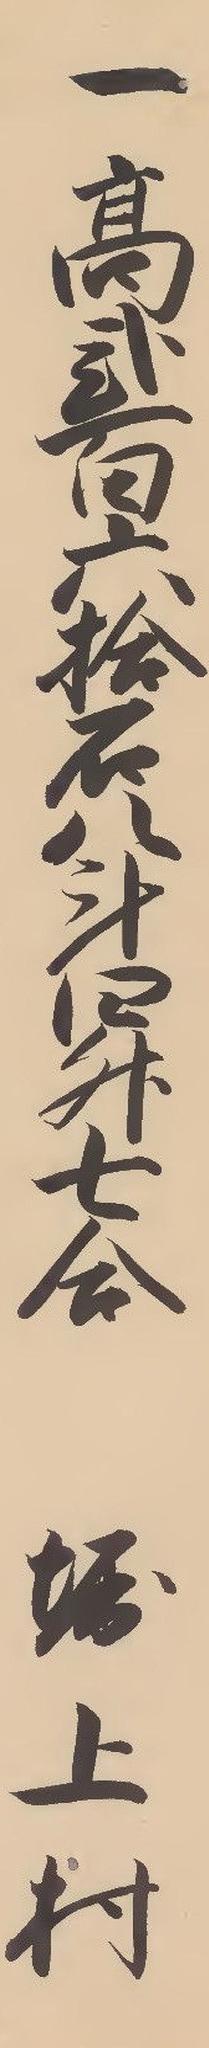一高弐百六拾石八斗四升七合堀上村
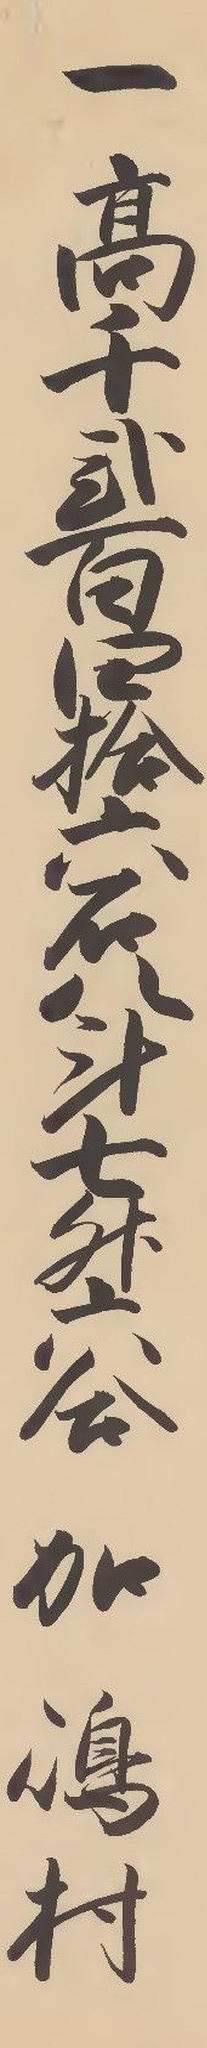一高千弐百四拾六石八斗七升六合加島村
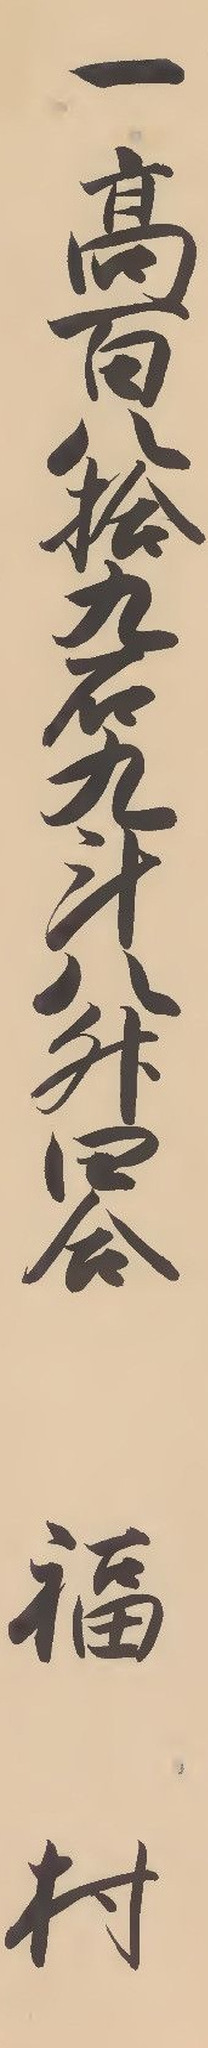一高百八拾九石九斗八升四合福村
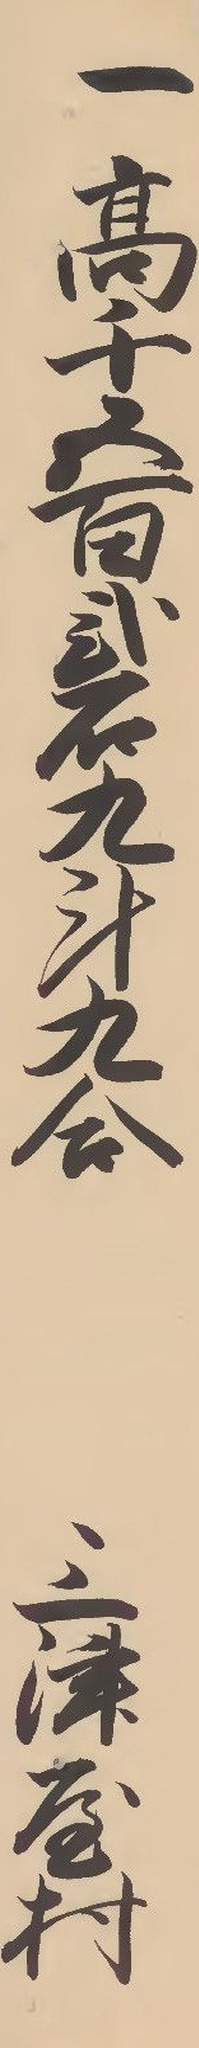一高千五百弐石九斗九合三津屋村
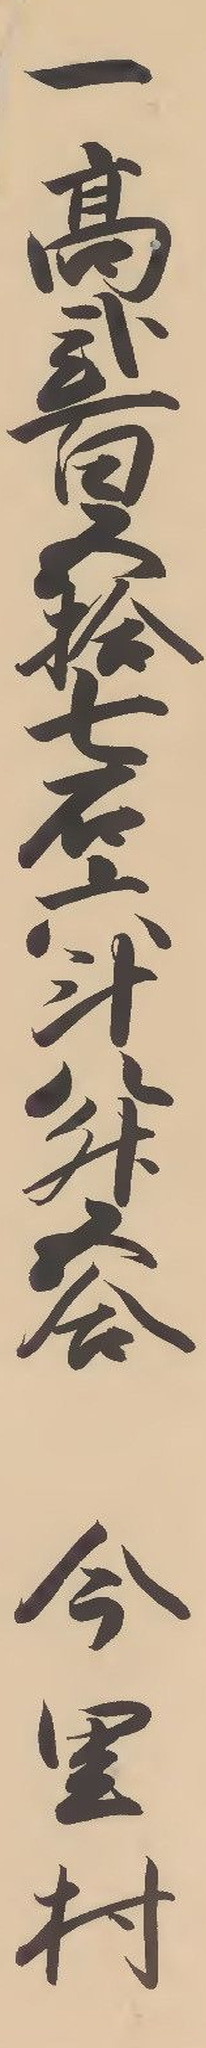一高弐百五拾七石六斗八升五合今里村
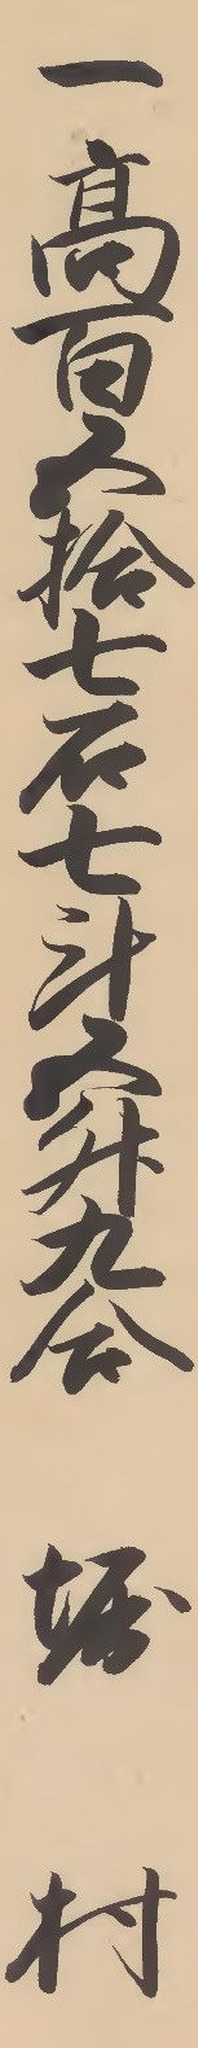一高百五拾七石七斗五升九合堀村
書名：摂津国郷帳
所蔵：国立公文書館 National Archives of Japan
